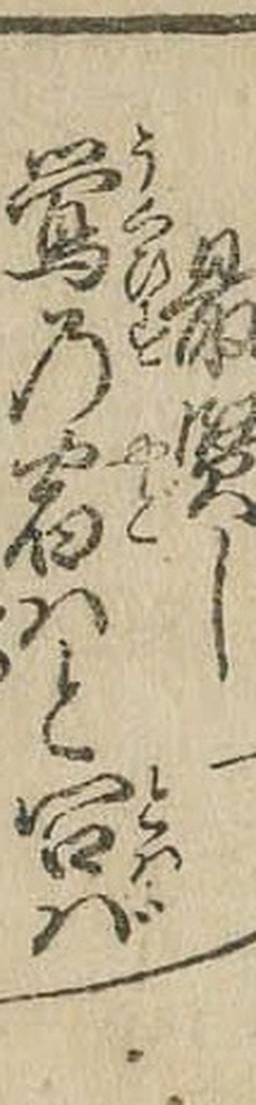鶯の宿はと問ば
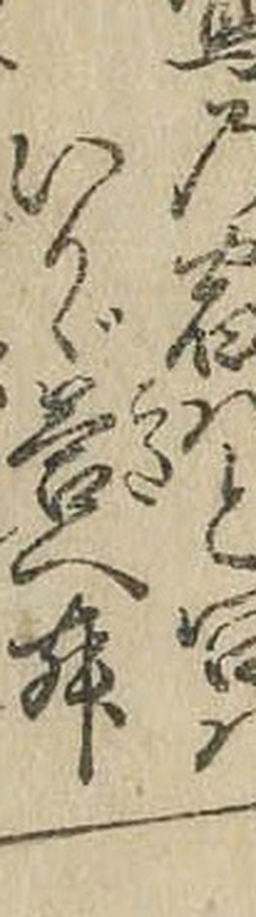いかゞ答へむ
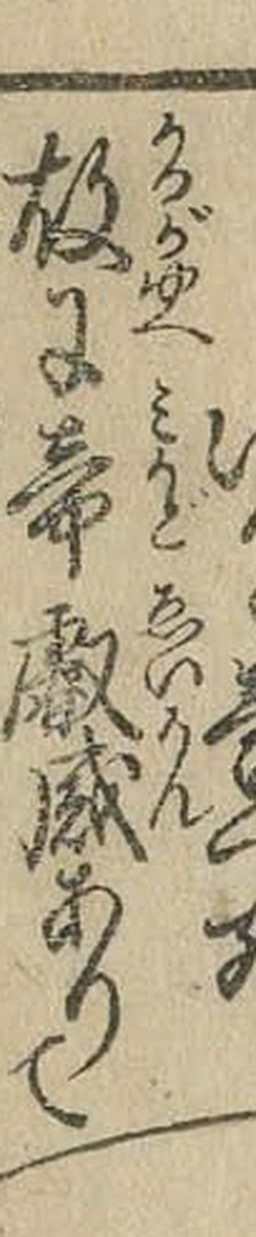故に帝叡感ありて
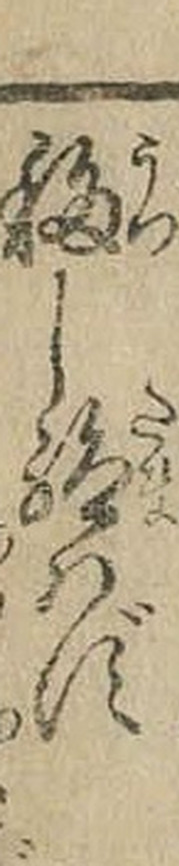移し給はず
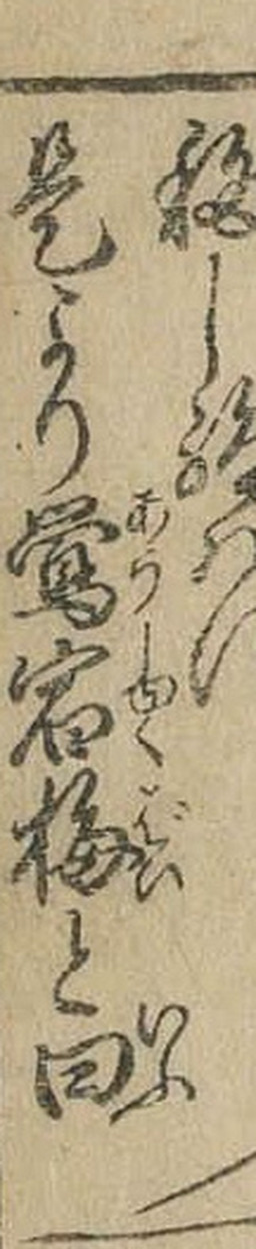是より鶯宿梅と曰
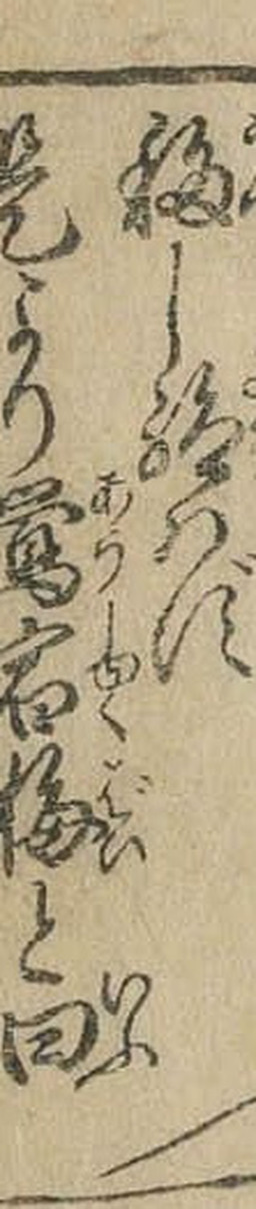是より鶯宿梅と曰

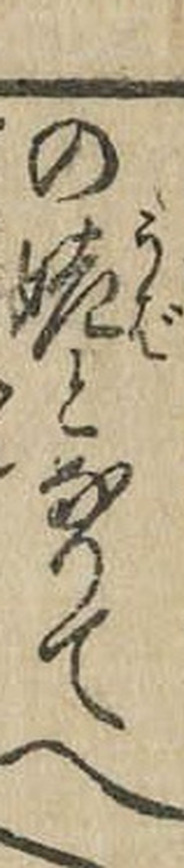の姥となりて
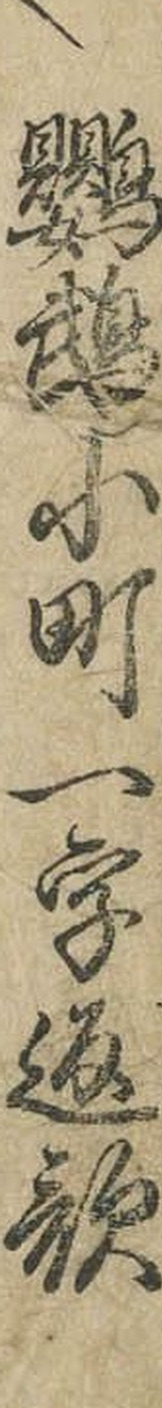鸚鵡小町一字返歌
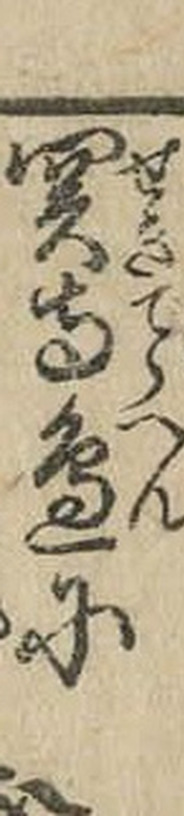関寺辺に
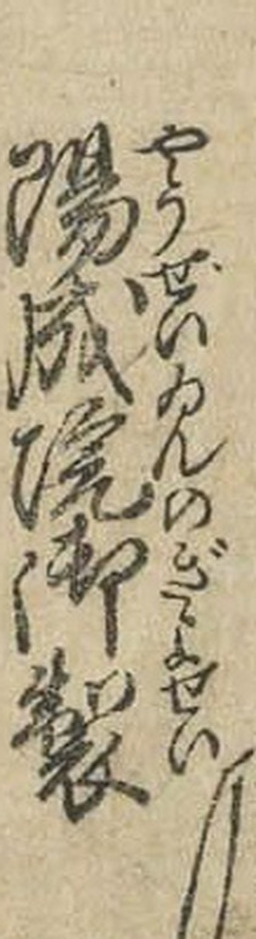陽成院御製
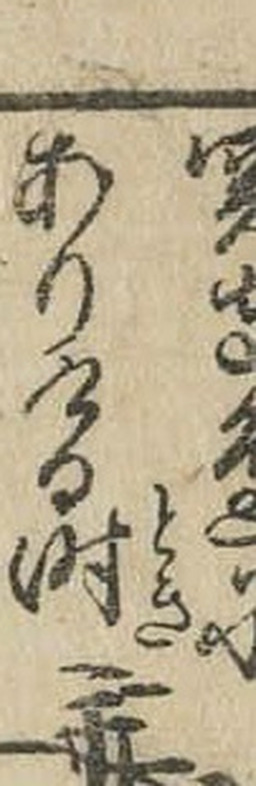ありける時
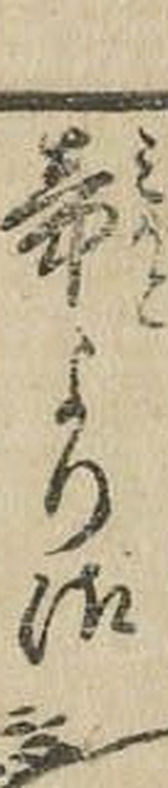帝より御
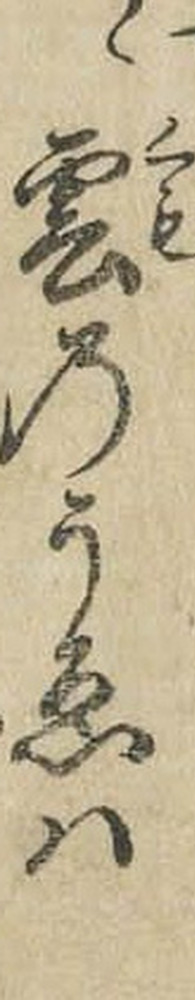雲のうゑは
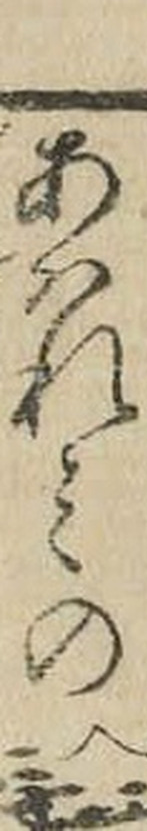あはれみの
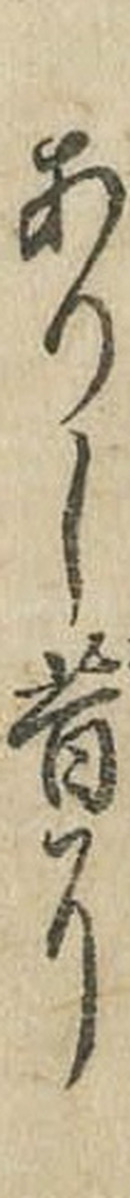ありし昔に
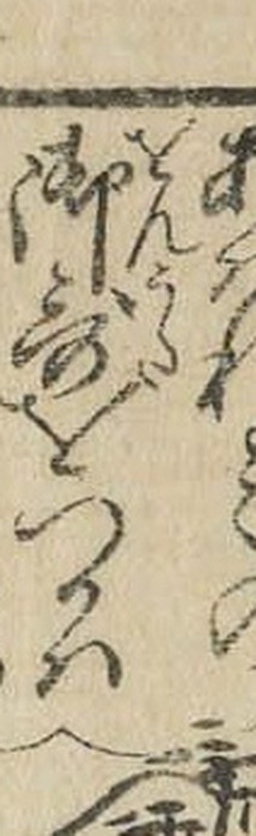御哥をつかは
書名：絵本写宝袋 9巻 1之巻
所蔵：東京学芸大学教育コンテンツアーカイブ
